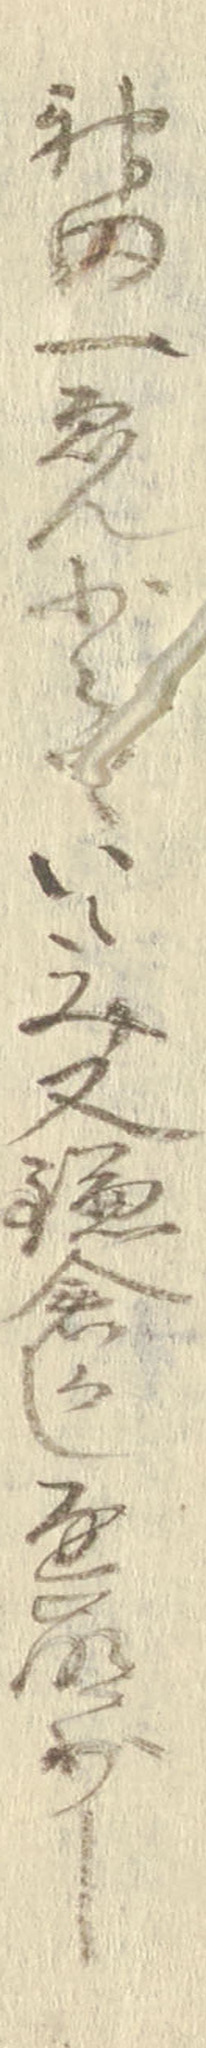神田一ゑん少〻ツヽいたみ又鎌倉かし通崩少し
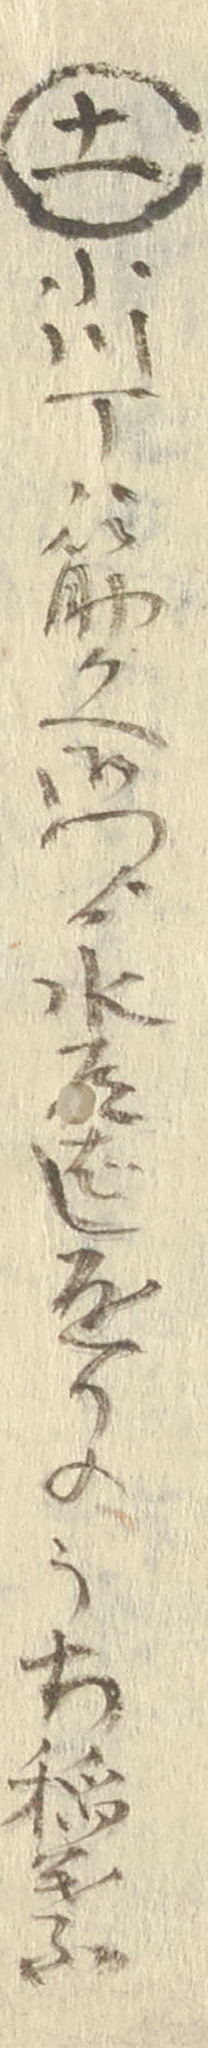十一小川丁筋かへ御門ゟ水道ばし通りのうち稲葉
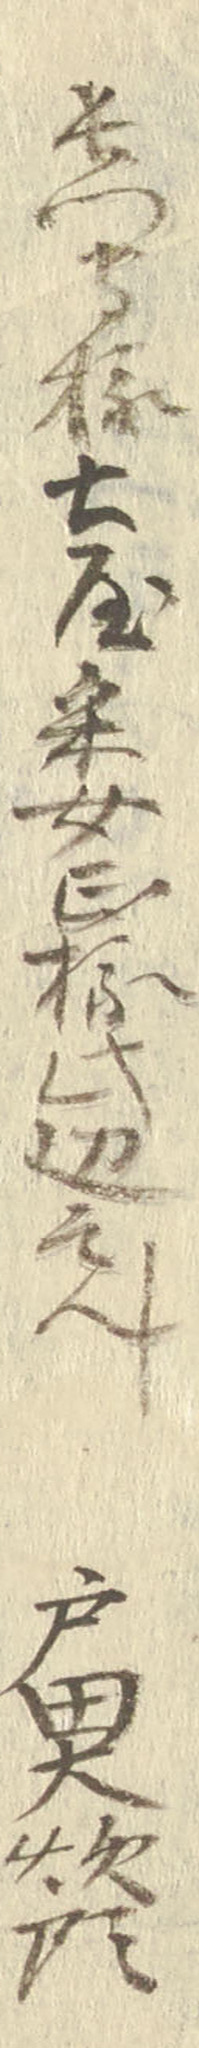長門守様土屋采女正様此辺そんし戸田大炊頭
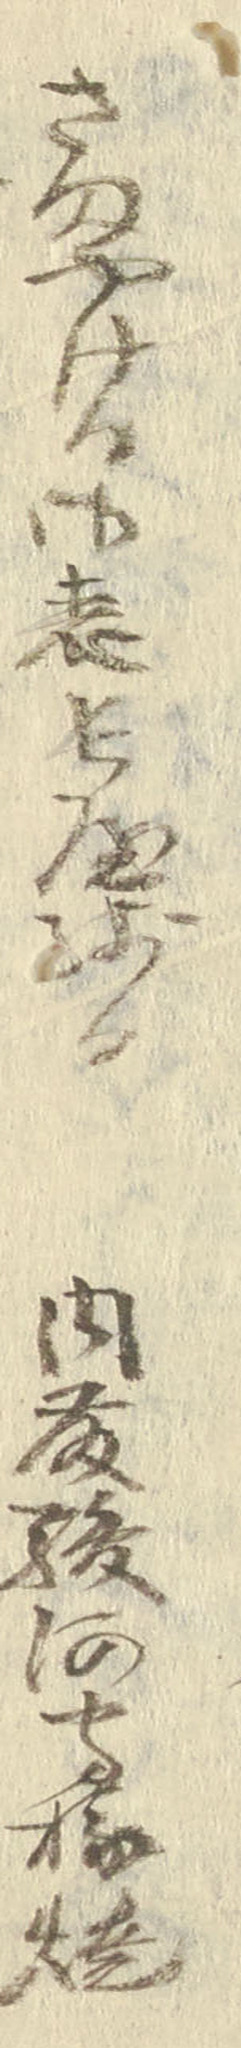さまやける御表長屋残る内藤駿河守様焼
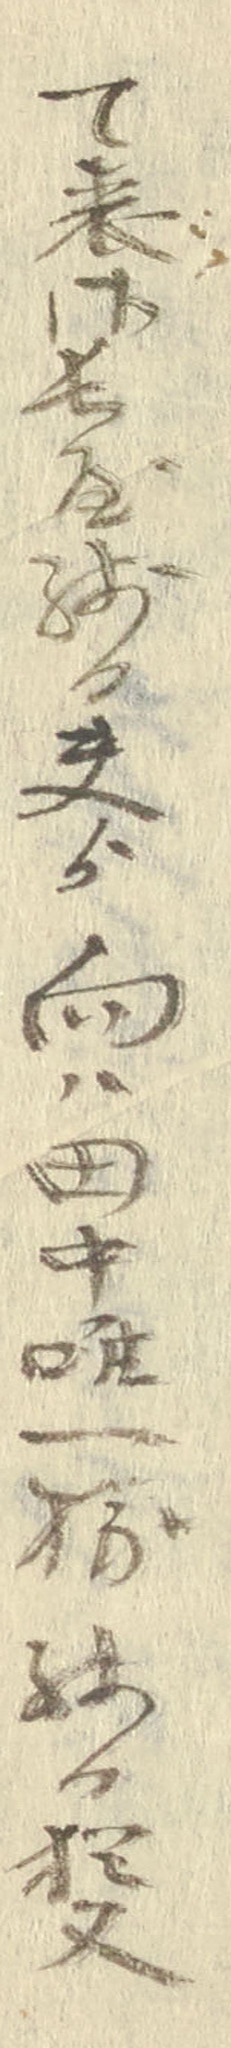て表御長屋残る夫ゟ向ハ田中唯一様残る猶又
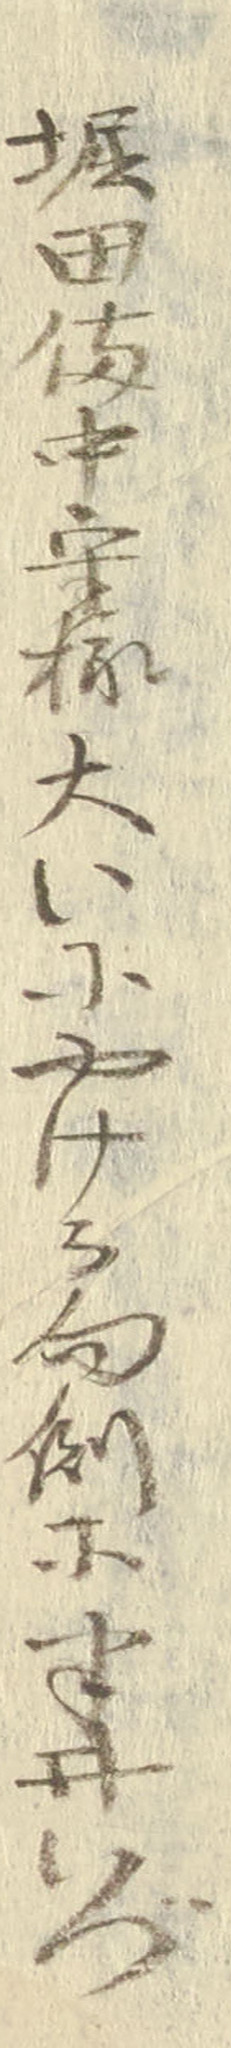堀田備中守様大いにやける向側に半井いづ
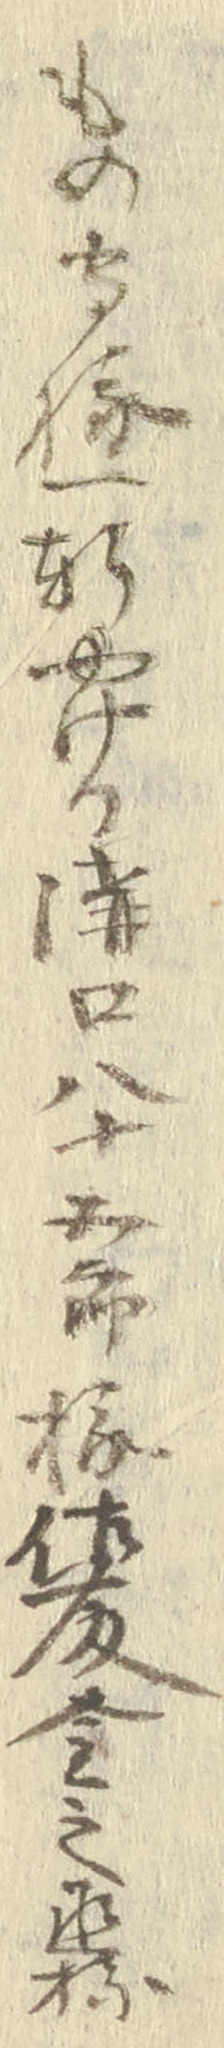もの守様一軒やける溝口八十五郎様佐藤金之丞様
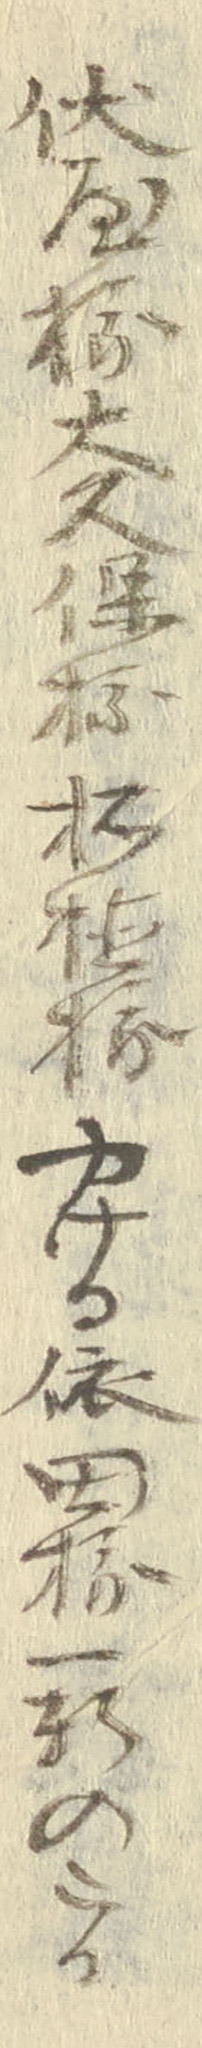伏屋様大久保様柘植様やける依田様一軒のこる
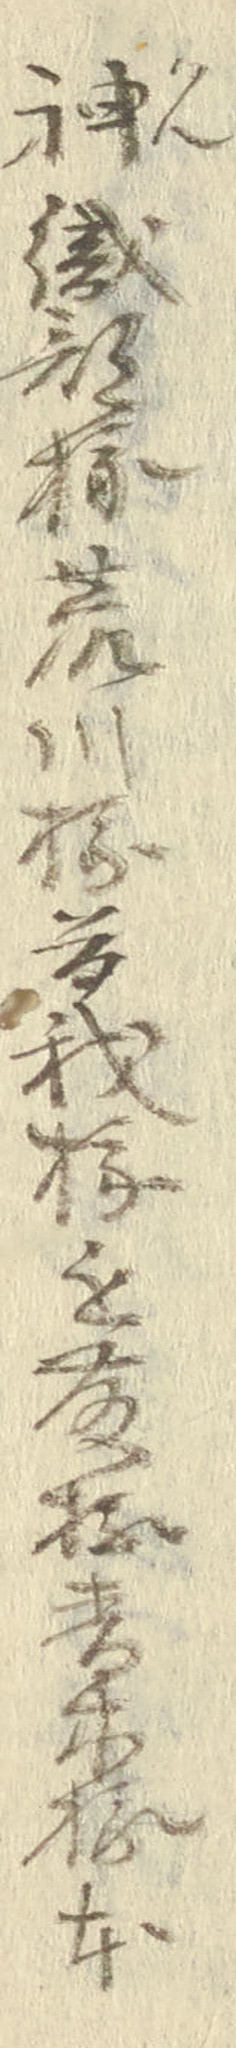神織部様荒川様曽我様近藤様青木様本
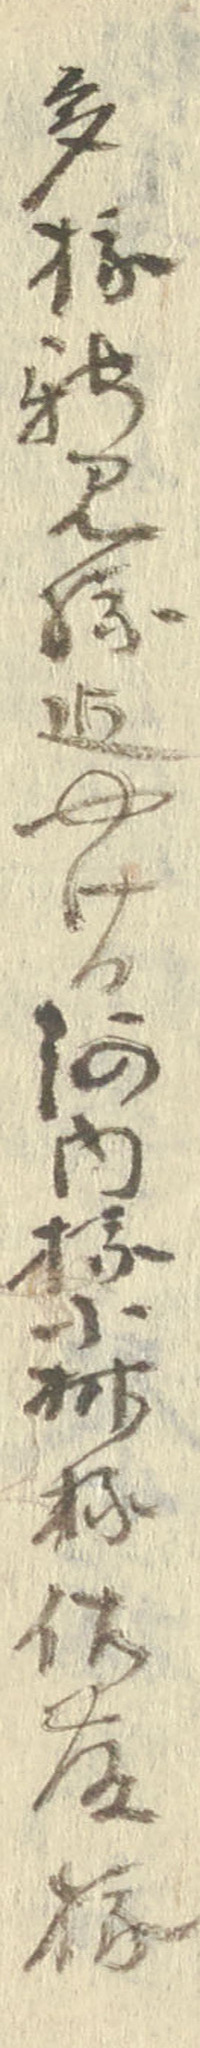多様新見様迄やける河内様小林様佐藤様
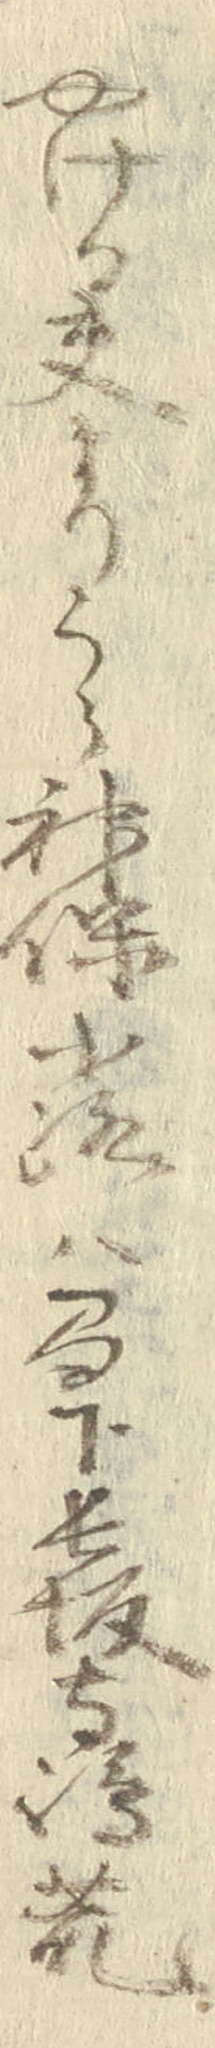やける夫よりうら神保小路ハ間下長坂寺嶋荒
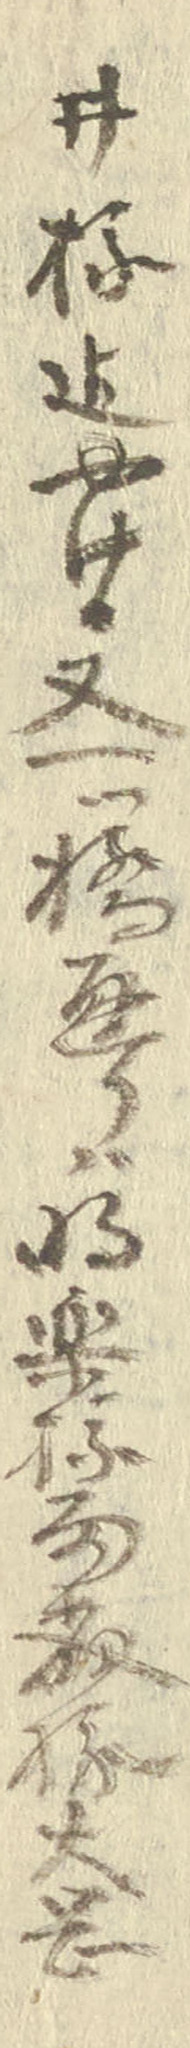井様迄やける又一ツ橋通りハ明楽様雨森様大岡
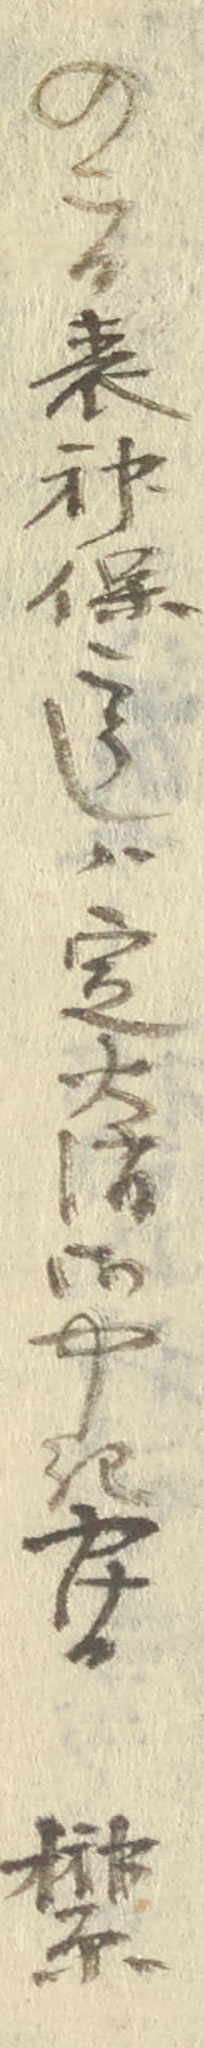のこる表神保こうしハ定火消御やしきやける榊原
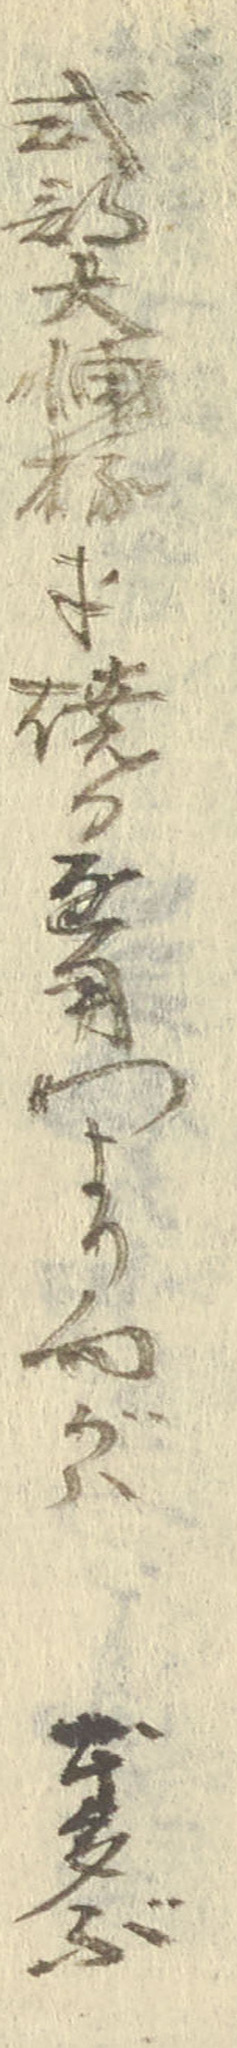式部大輔様半焼る通用門より向がハ本多ぶ
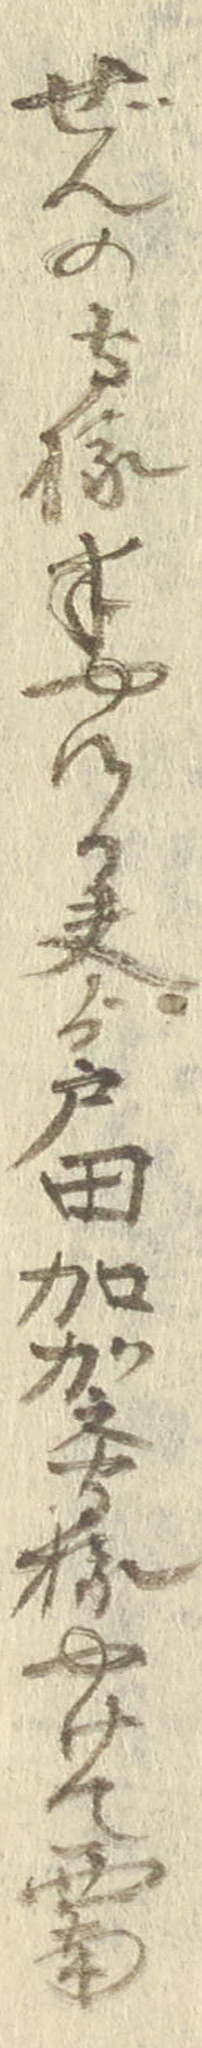ぜんの守様半やけり夫ゟ戸田加賀守様やけて西南
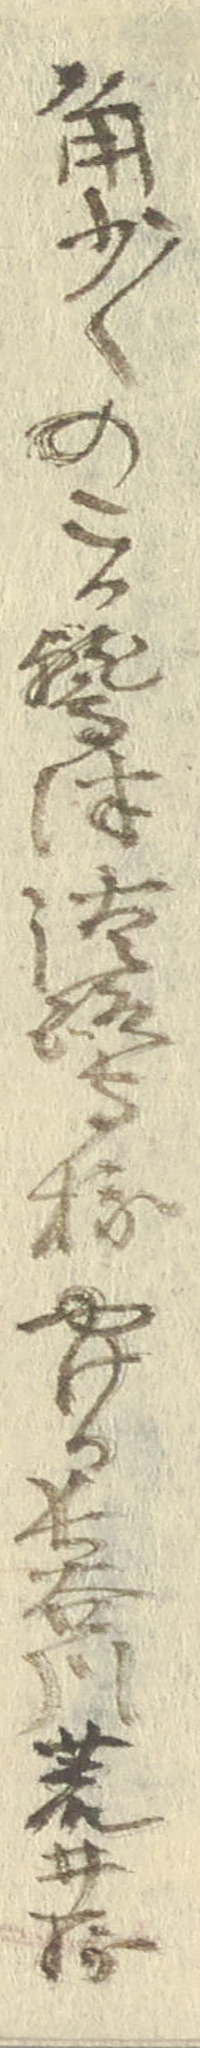角少〳〵のこる鷲津淡路守様やける長谷川荒井様
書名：御府内御屋敷方市中共地震類焼場所明細書之冩兼街道筋近郷聞書
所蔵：東京大学総合図書館 General Library in the University of Tokyo, JAPAN
